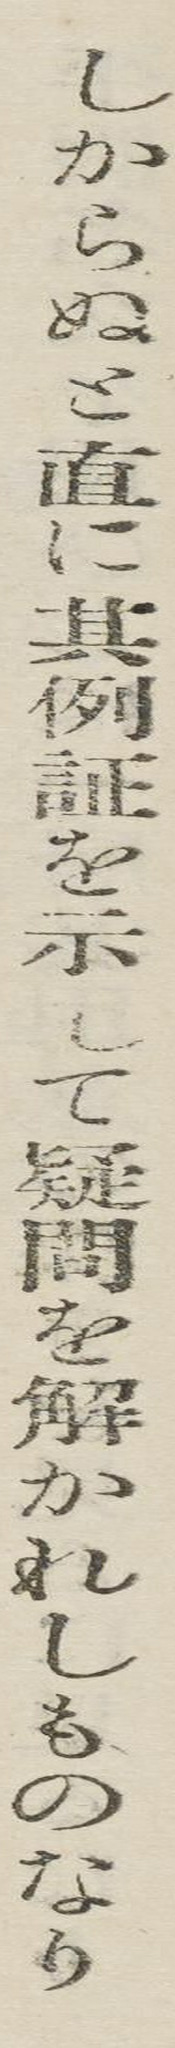しからぬと直に其例証を示して疑問を解かれしものなり
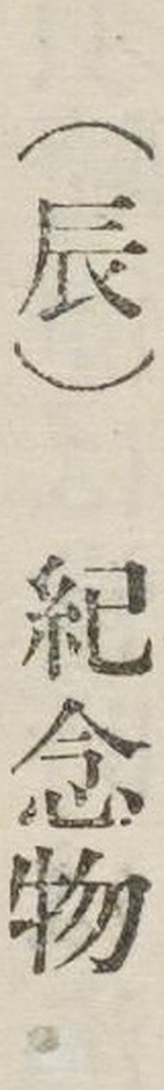紀念物
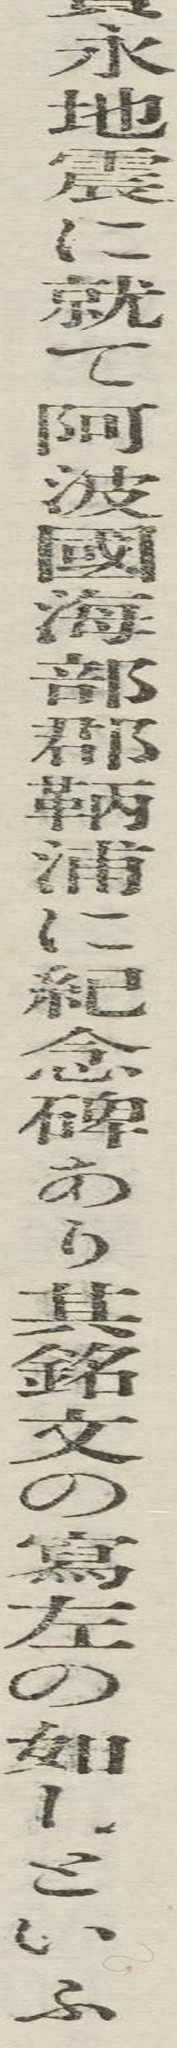宝永地震に就て阿波国海部郡鞆浦に紀念碑あり其銘文の写左の如しといふ
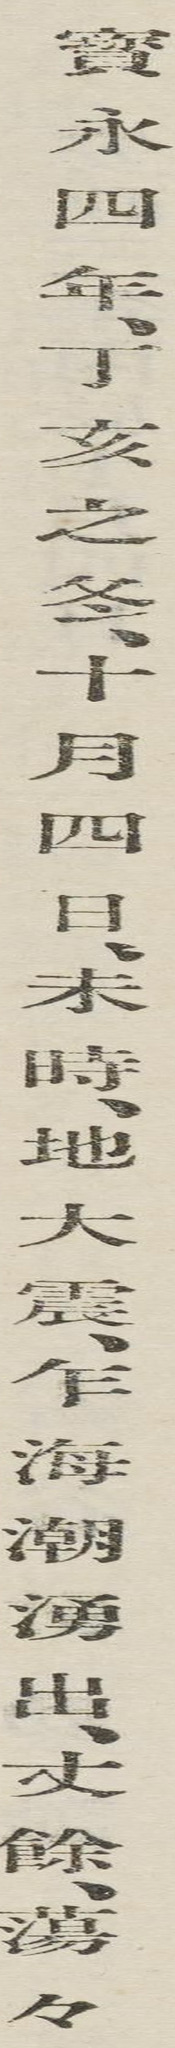宝永四年、丁亥之冬、十月四日、未時、地大震、乍海潮湧出、丈余、蕩々
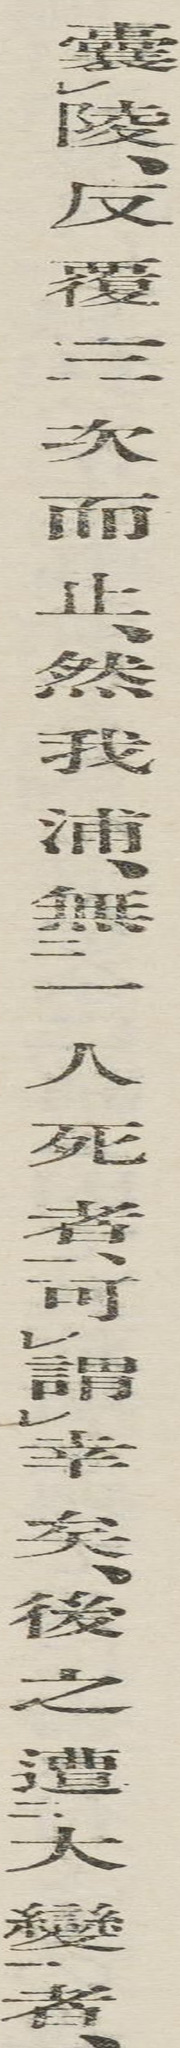嚢陵、反覆三次而止、然我浦、無一人死者、可謂幸矣、後之遭大変者、
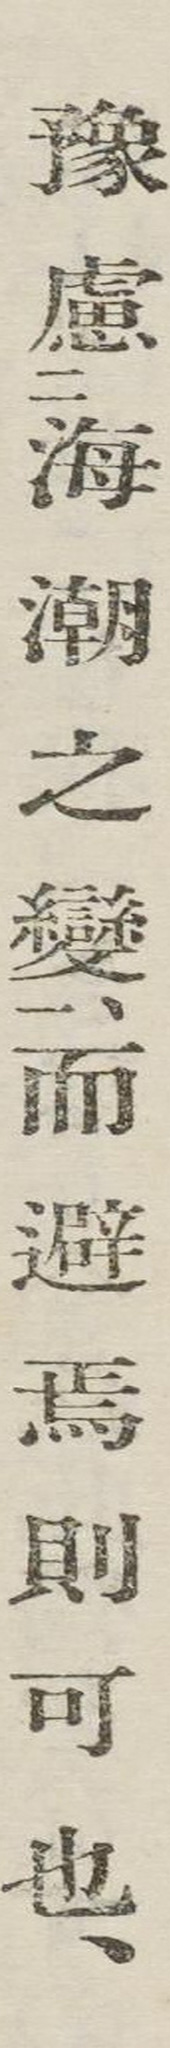予慮海潮之変、而避焉則可也、
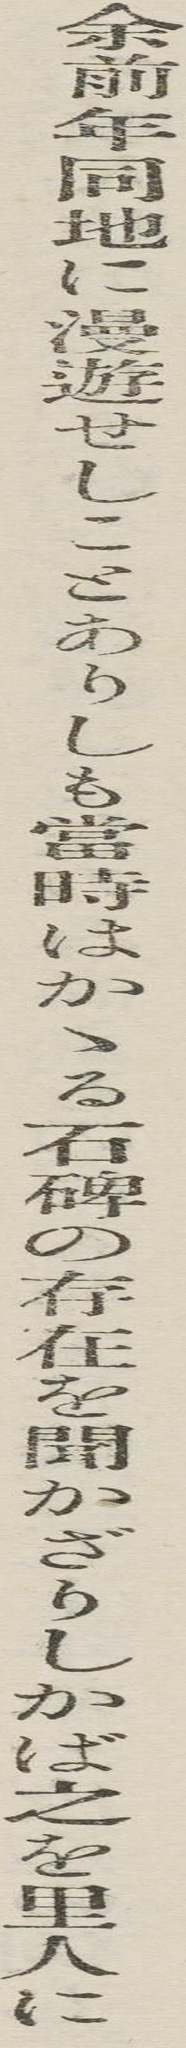余前年同地に漫遊せしことありしも当時はかゝる石碑の存在を聞かざりしかば之を里人に
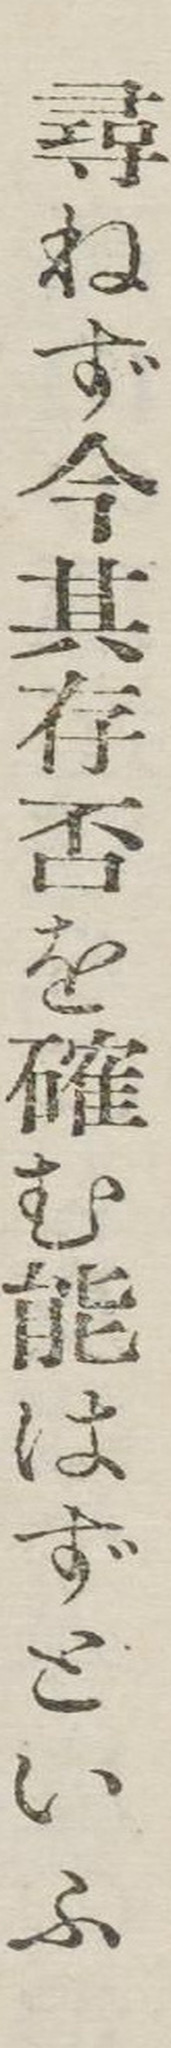尋ねず今其存否を確む能はずといふ
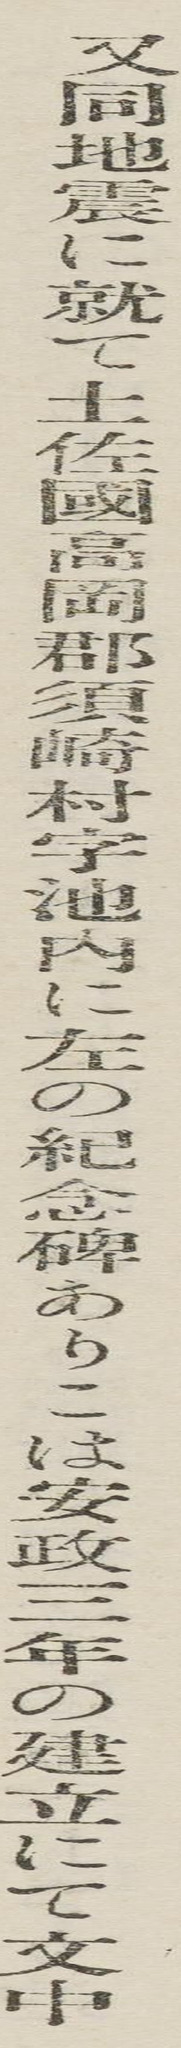又同地震に就て土佐国高岡郡須崎村字池内に左の紀念碑ありこは安政三年の建立にて文中
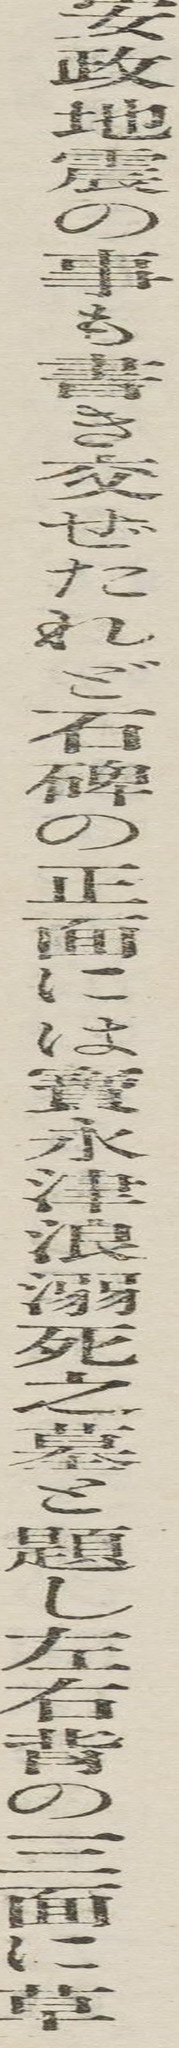安政地震の事も書き交ぜたれど石碑の正面には宝永津浪溺死之墓と題し左右背の三面に草
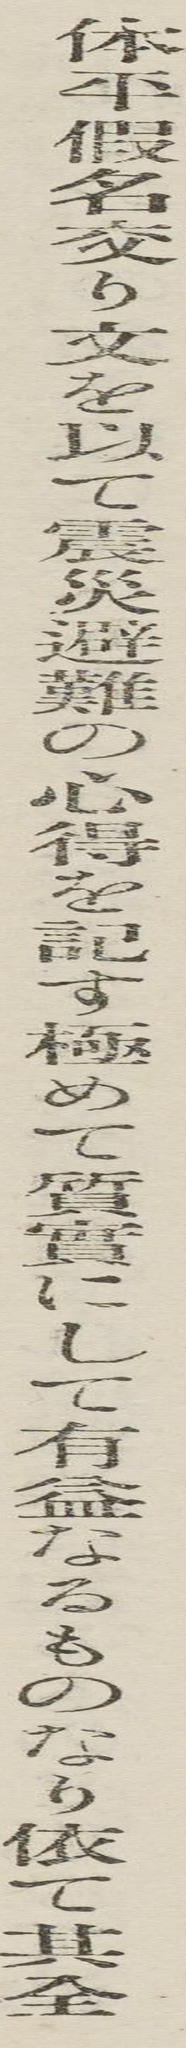体平仮名交り文を以て震災避難の心得を記す極めて質実にして有益なるものなり依て其全
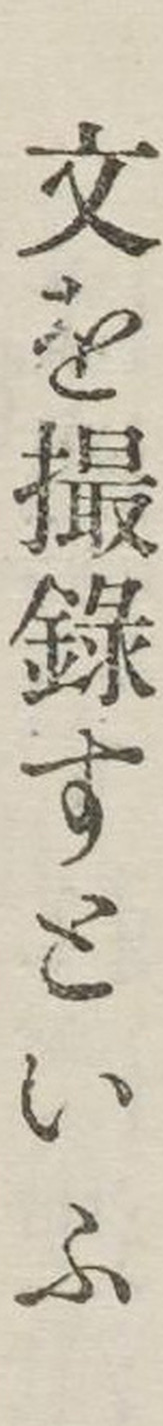文を撮録すといふ
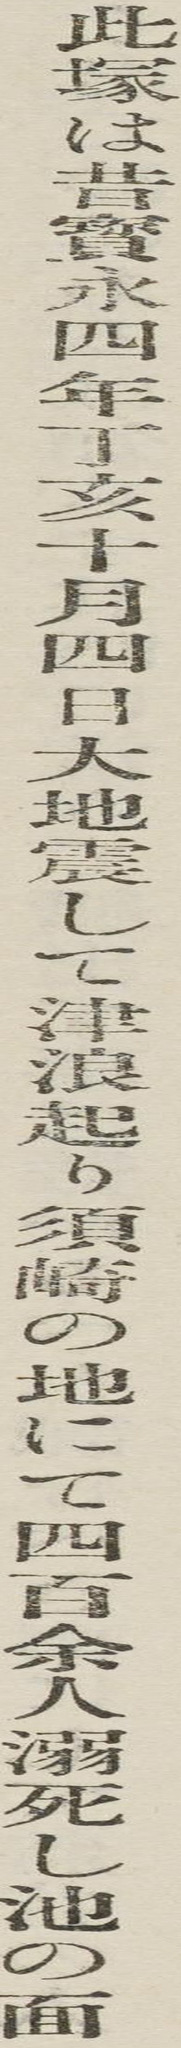此塚は昔宝永四年丁亥十月四日大地震して津波起り須崎の地にて四百余人溺死し池の面
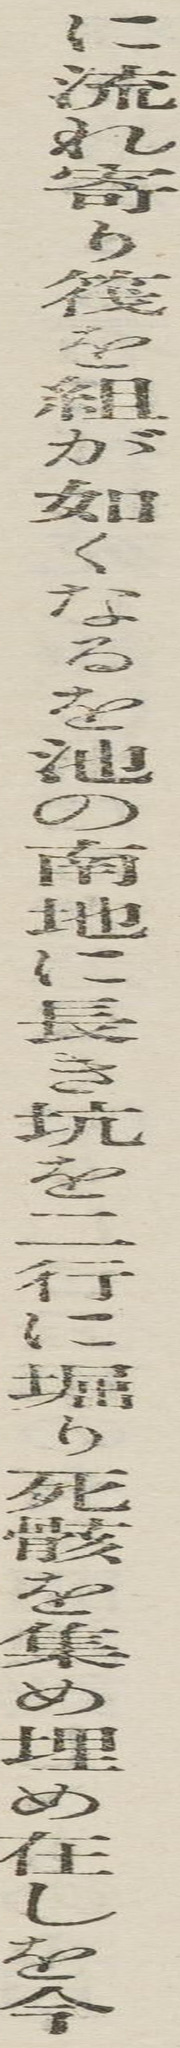に流れ寄り筏を組が如くなるを池の南地に長き坑を二行に堀り死骸を集め埋め在しを今
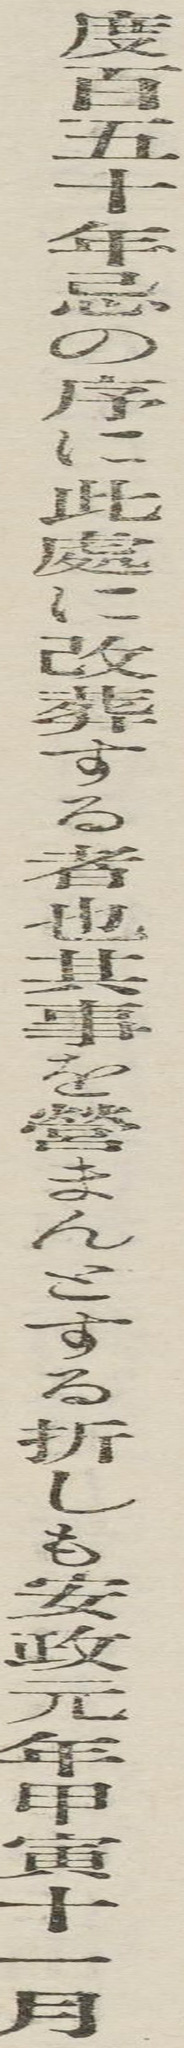度百五十年忌の序に此処に改葬する者也其事を営まんとする折しも安政元年甲寅十一月
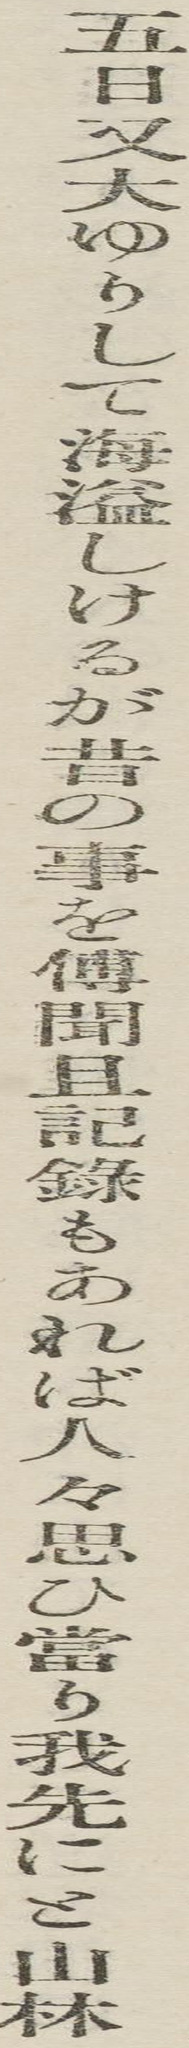五日又大ゆりして海溢しけるが昔の事を伝聞且記録もあれば人々思ひ当り我先にと山林
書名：土佐古今ノ地震
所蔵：東京大学地震研究所図書室 Earthquake Research Institute Library, The University of Tokyo, JAPAN
